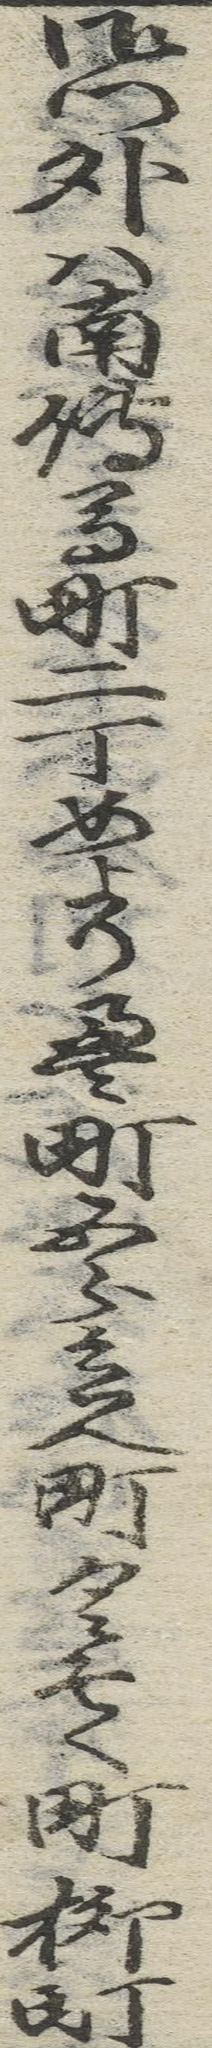御門他は南伝寺町二丁目より畳町五郎兵へ町具そく町柳町
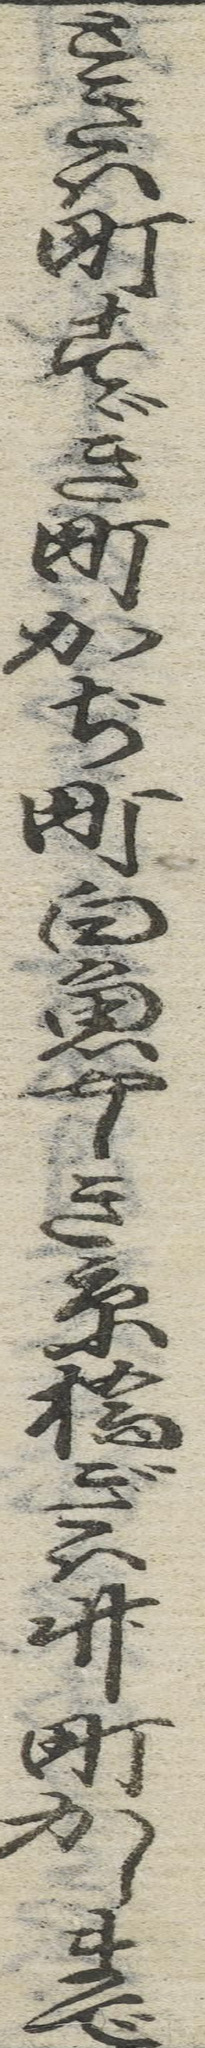ときは町すゞき町かぢ町白魚やしき京橋ぎは竹町かしまで
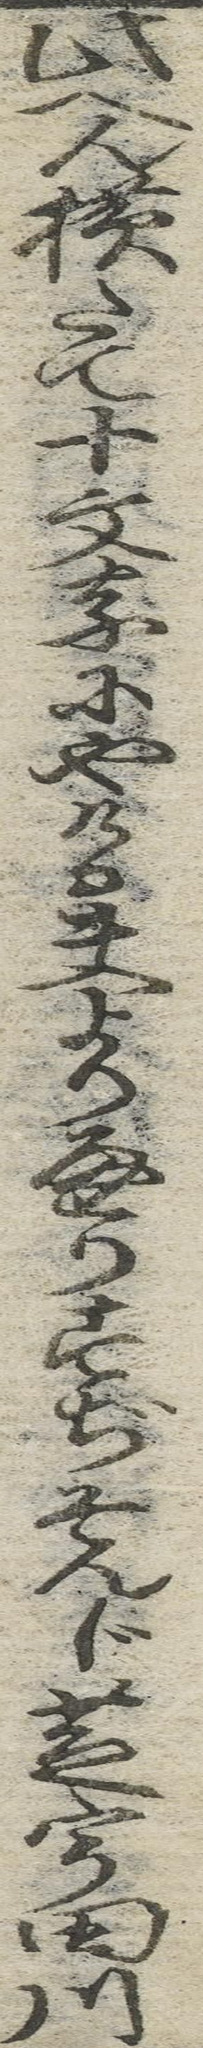此へん損たて十文字にやける夫より通りすぢそんじ芝宇田川
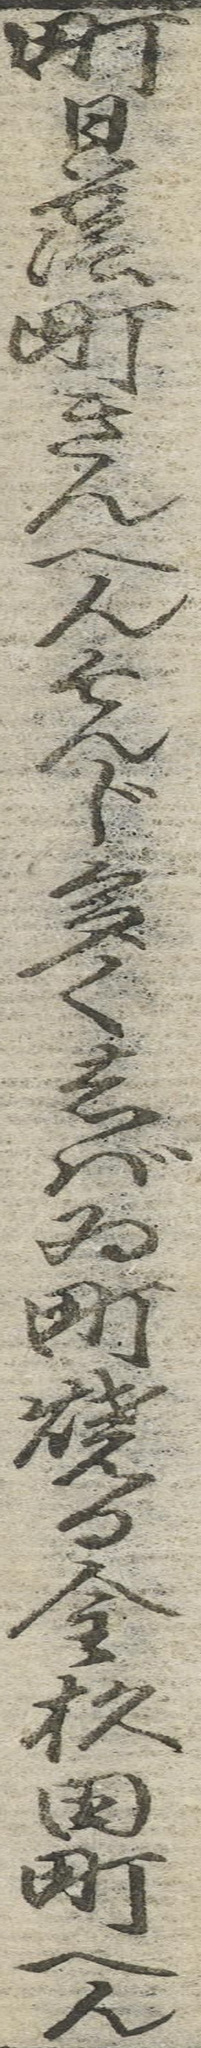町日蔭町きんへんそんじ多くしばゐ町焼る金杉田町へん

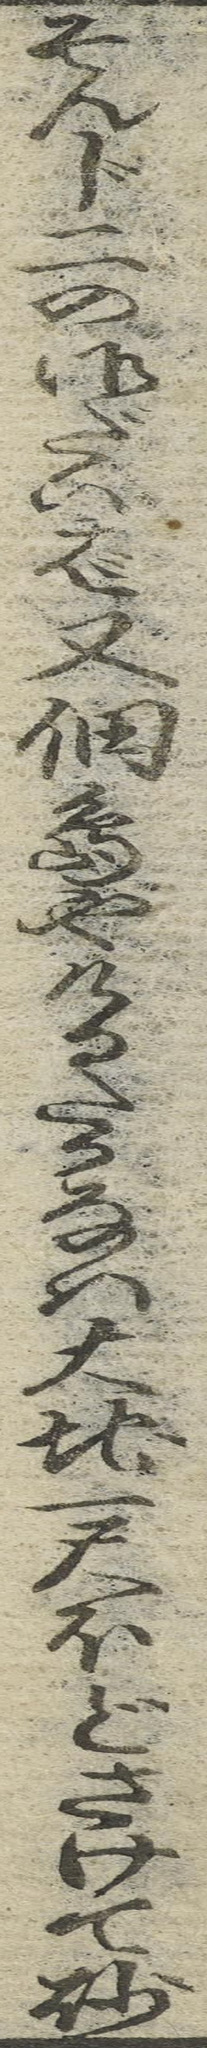そんじ二の御だいば又佃島やけるたかなは大地一尺ほどさけて砂
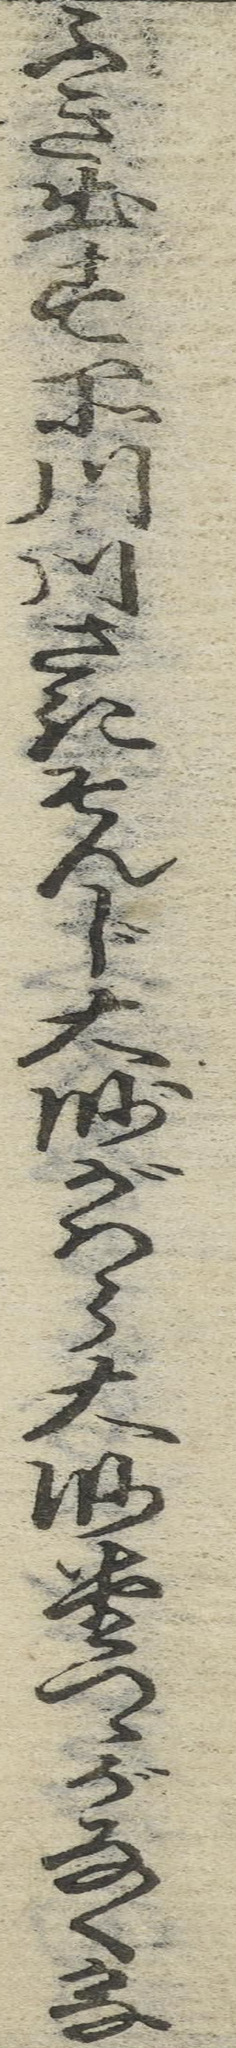ふき出す品川川さきそんじ大師がはら大師堂つゝがなくかな
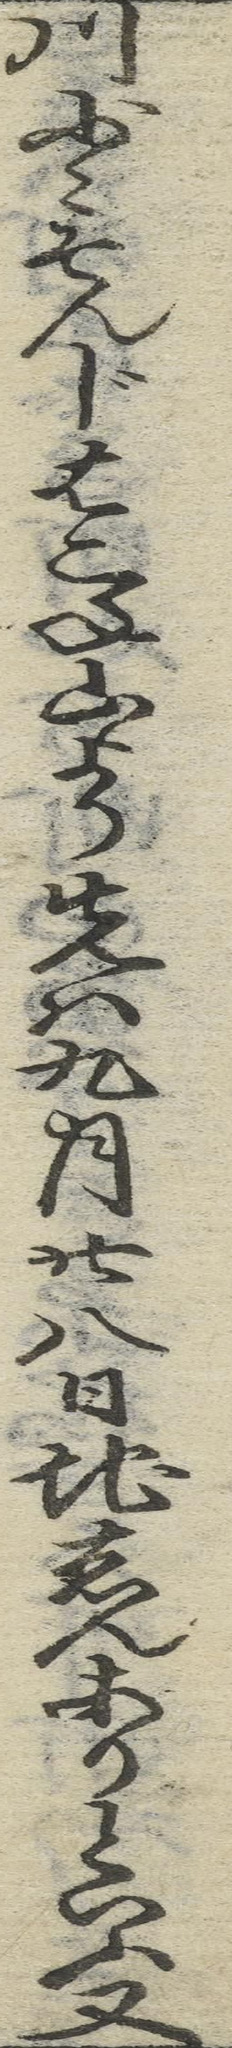川少〻そんじはこね山より先は九月廿八日地しんありといふ又
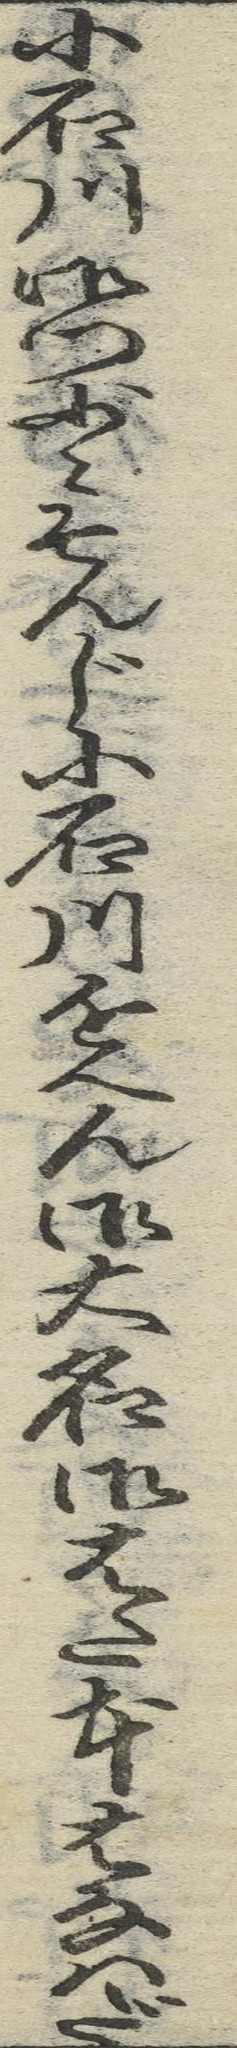小石川御門少〻そんじ小石川近へん御大名御はた本はなはだ
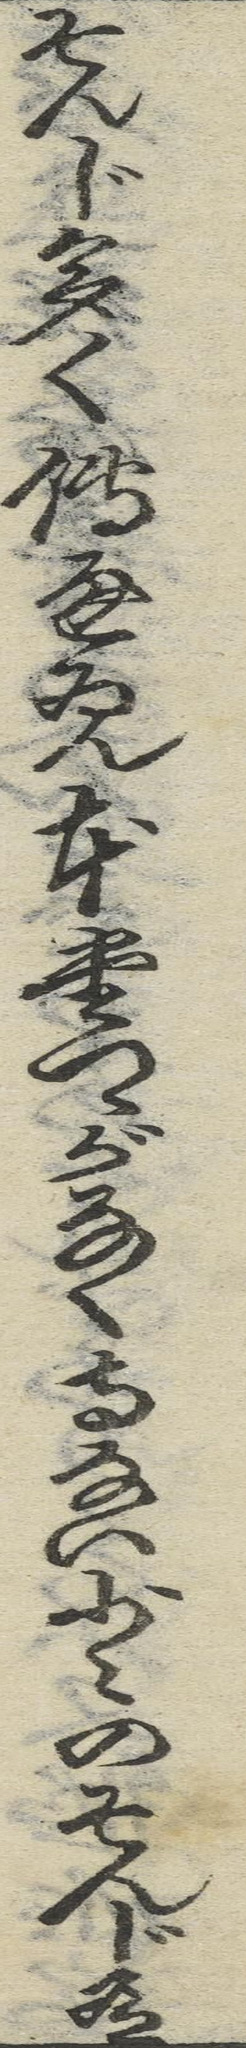そんじ多く伝通ゐん本堂つゝがなく寺ない少〻のそんじ有
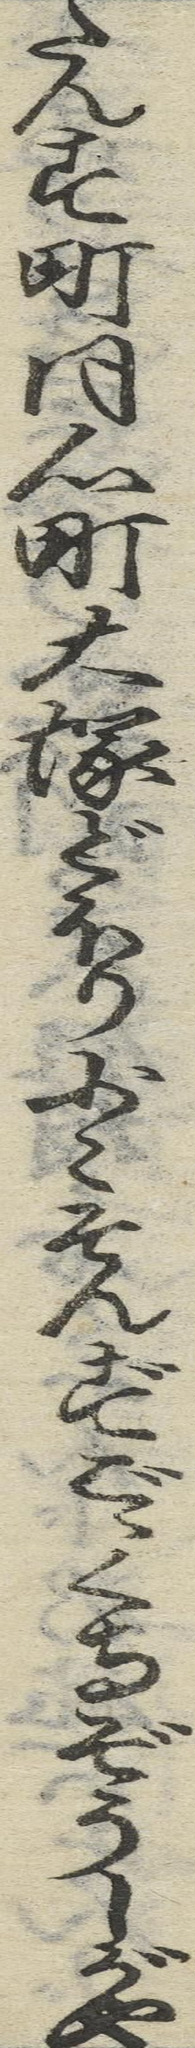たんす町内石町大塚どほり少〻そんずごゝく寺ぞうしがや
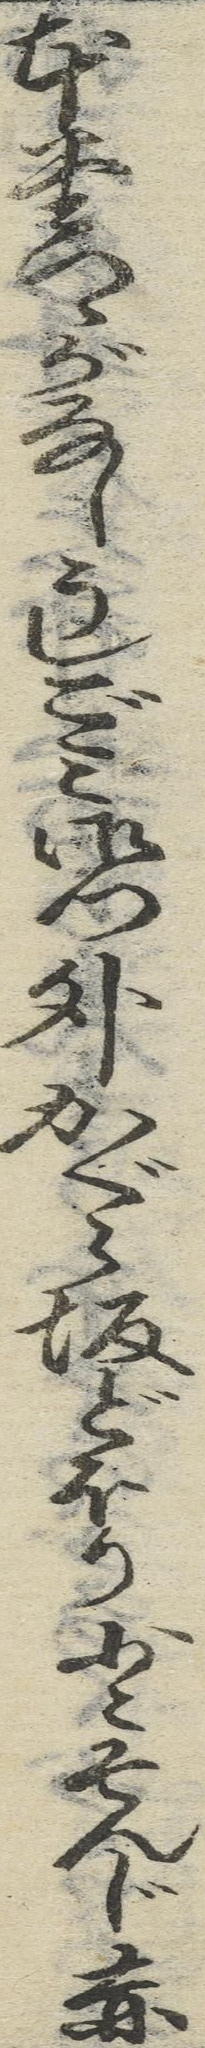本堂つゝがなしうしごみ御門外かぐら坂どほり少〻そんじ赤
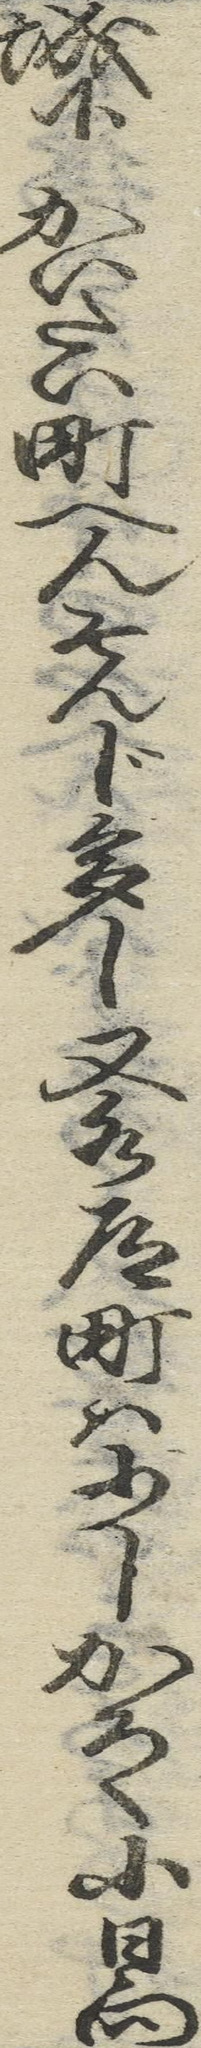城下かいたい町へんそんじ多し又水道町は少しかろく小日向
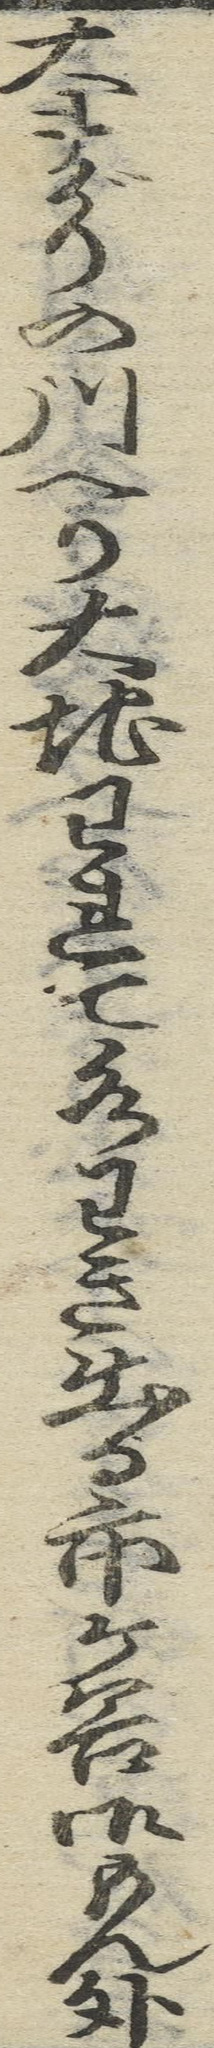大まがりの川へり大地われて水わき出る市ケ谷御門外
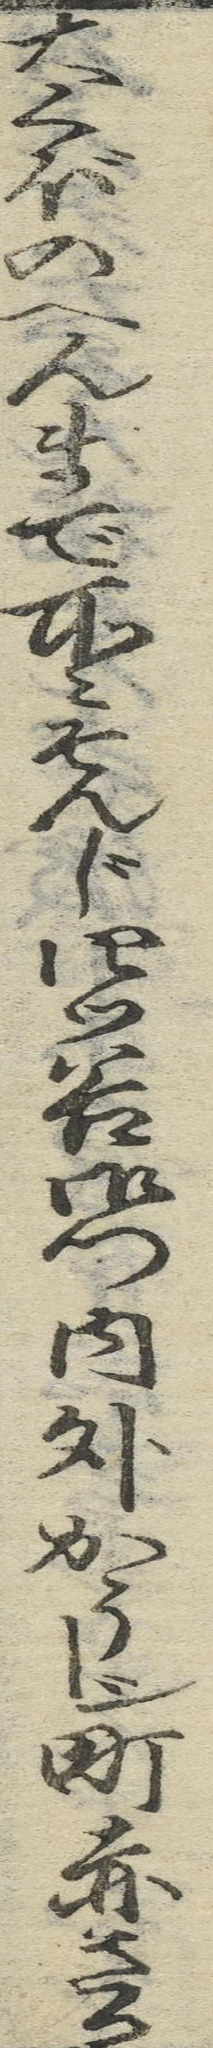大くぼのへんまで所〻そんじ四ツ谷御門内外かうじまち赤さか
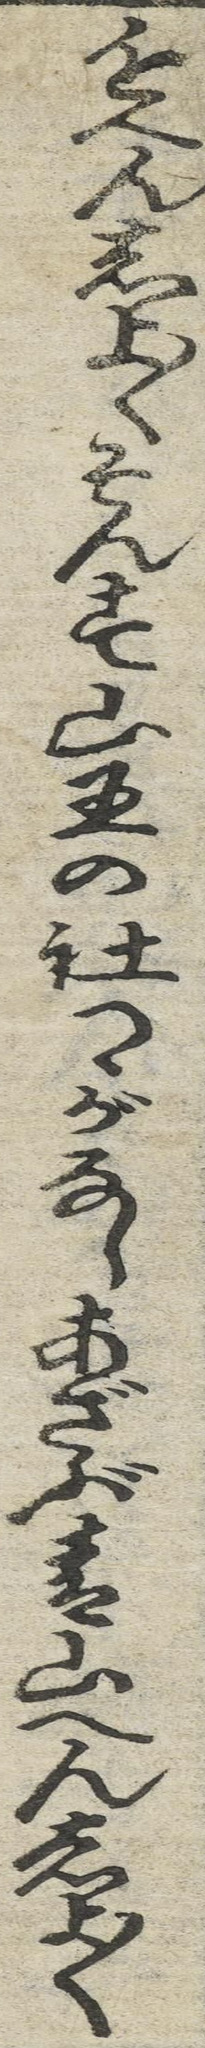近へんしよ〳〵そんす山王の社つがなしあざぶ青山へんしよ〳〵
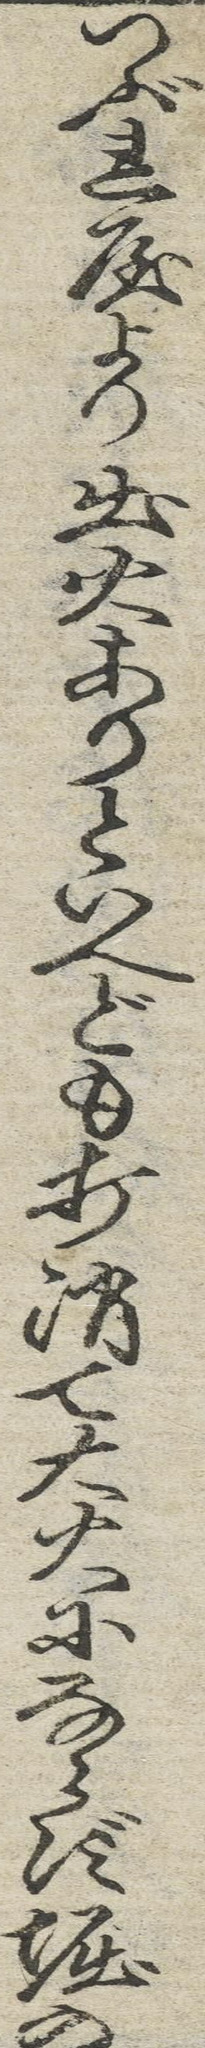つぶれ屋より出火ありといへども打消て大火にならず堀の
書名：関東　大地震細記
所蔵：東京大学地震研究所図書室 Earthquake Research Institute Library, The University of Tokyo, JAPAN
